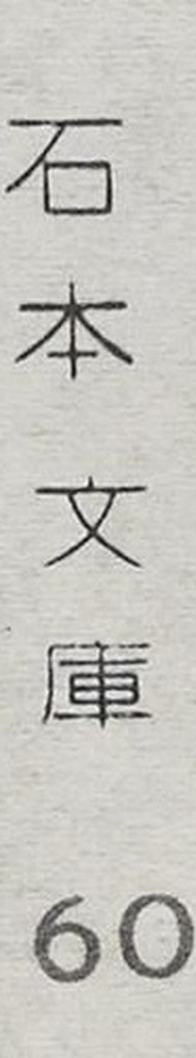石本文庫

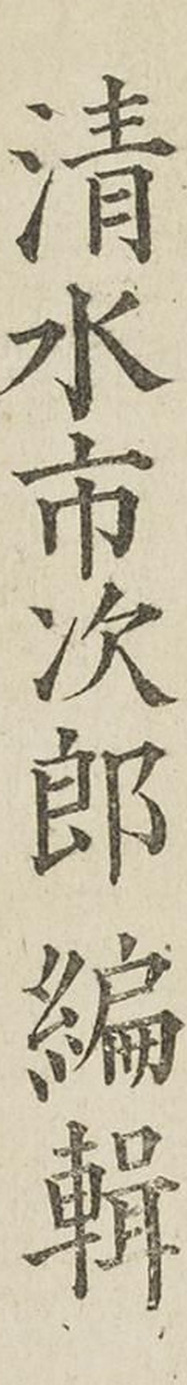清水市次郎編輯
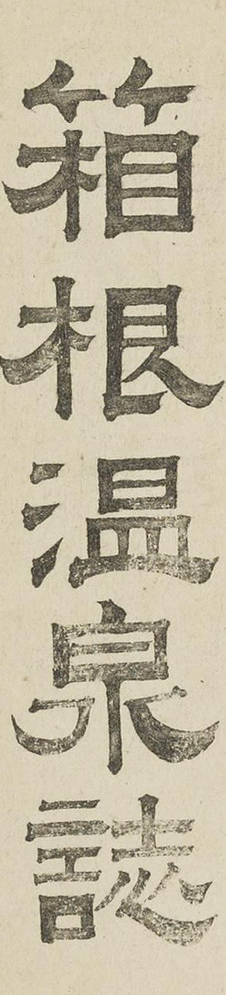箱根温泉誌
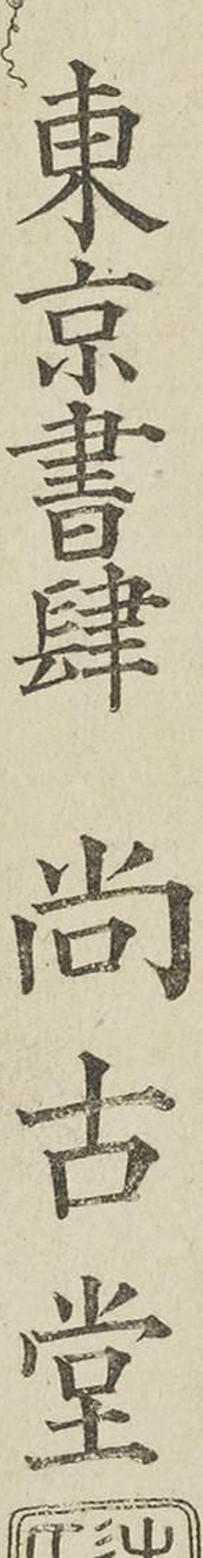東京書肆尚古堂

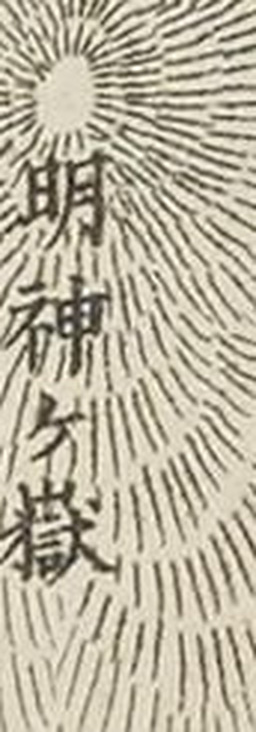明神ヶ嶽
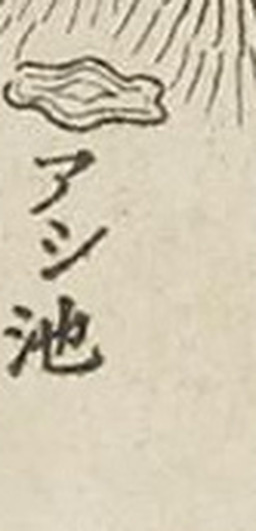アシ池
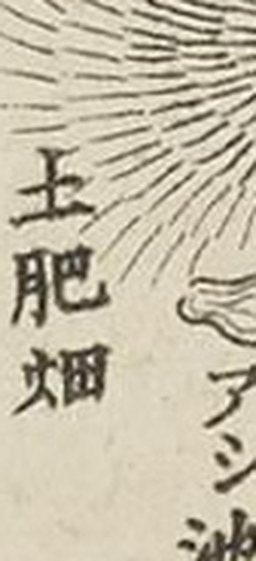土肥畑
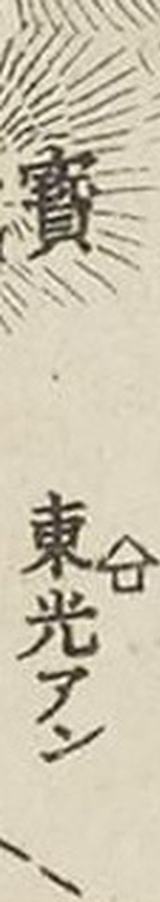東光アン
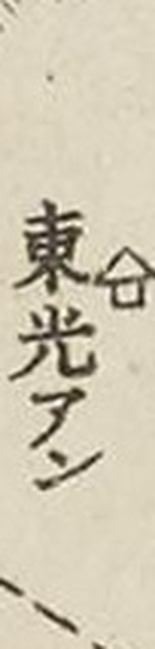東光アン
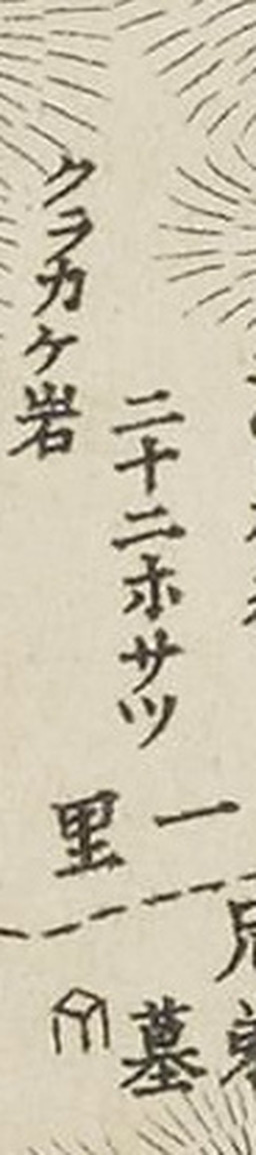クラカケ岩畑
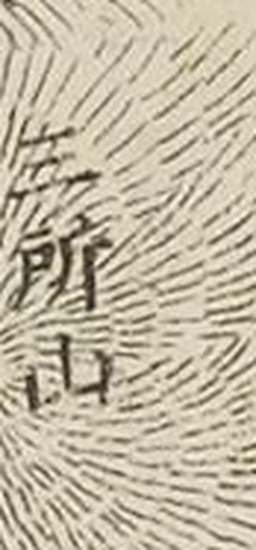三所山

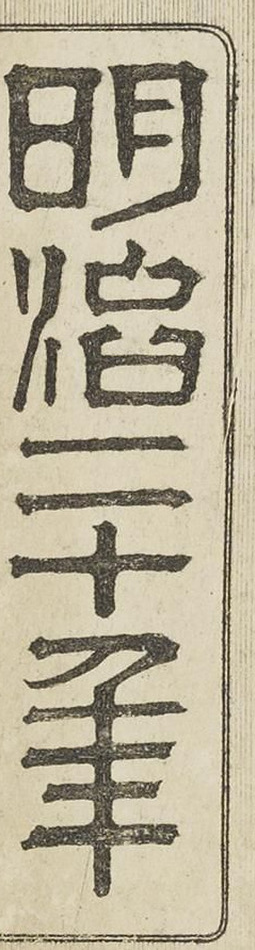明治二十年
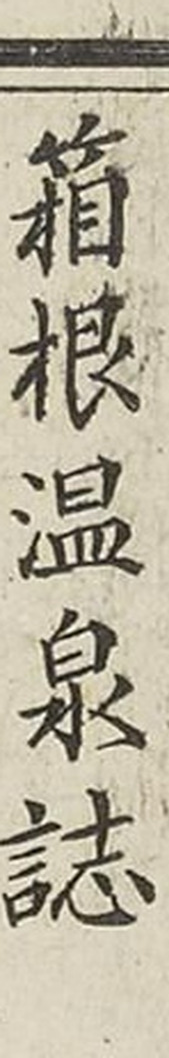箱根温泉誌
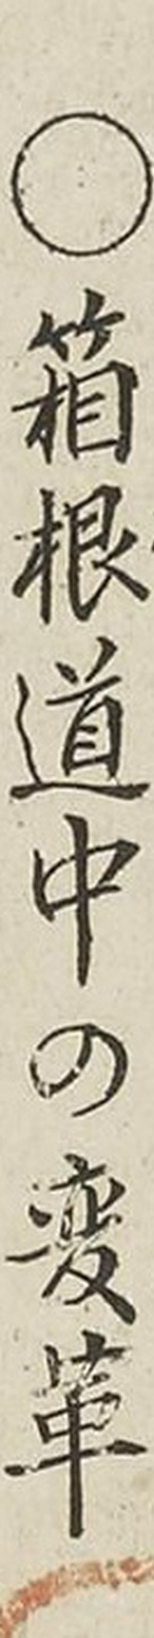○箱根道中の変革
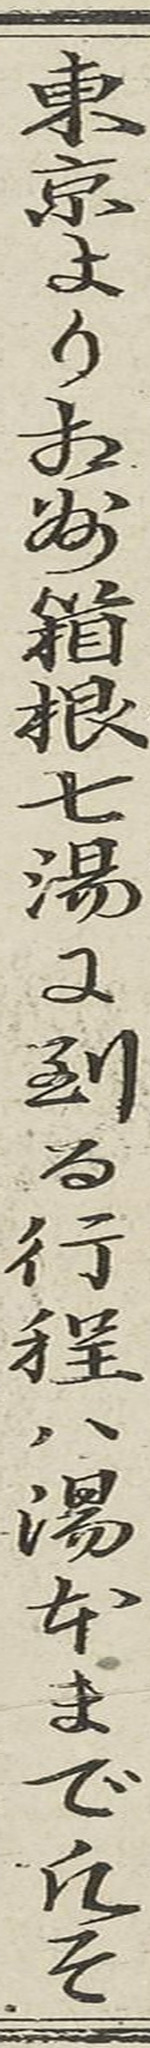東京より相州箱根七湯に到る行程は湯本まで凡そ
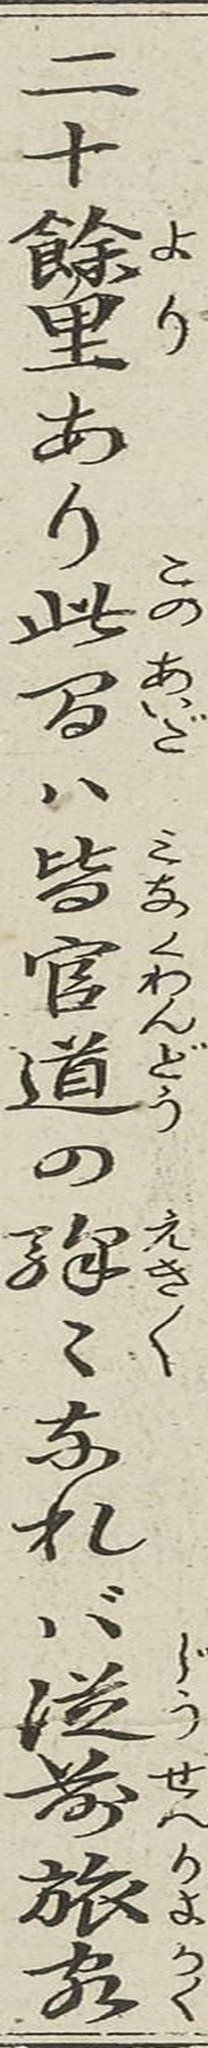二十余里あり此間は皆官道の駅々なれば従前旅客
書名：箱根温泉誌　全
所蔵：東京大学地震研究所図書室 Earthquake Research Institute Library, The University of Tokyo, JAPAN
